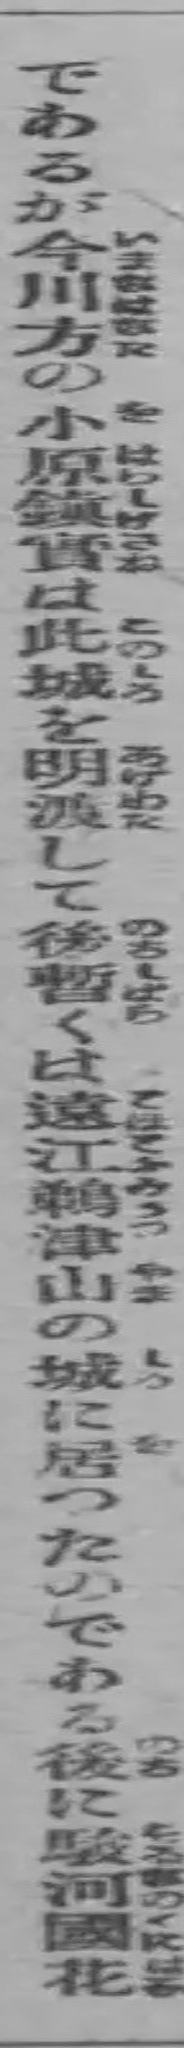であるが今川方の小原鎮実は此城を明渡して後暫くは遠江鵜津山の城に居つたのである後に駿河国花

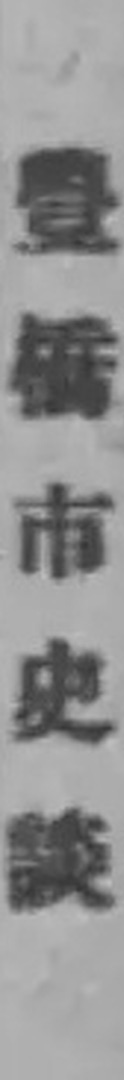豊橋市史談
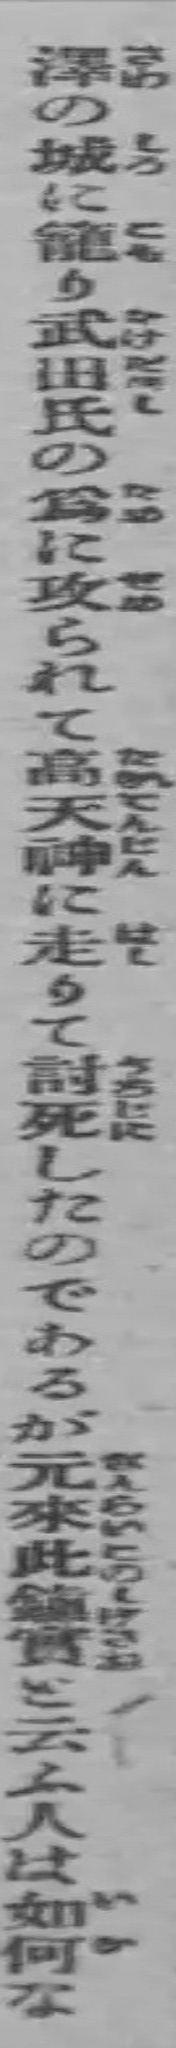沢の城に籠り武田氏の為に攻られて高天神に走りて討死したのであるが元来此鎮実と云ふ人は如何な
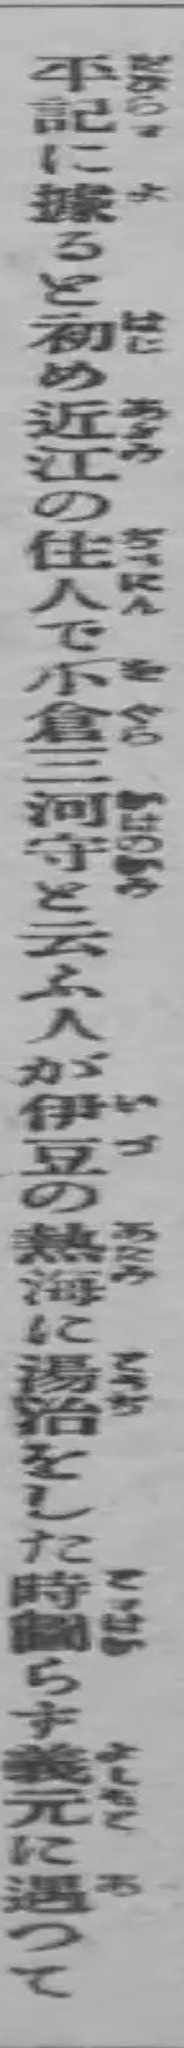平記に拠ると初め近江の住人で小倉三河守と云ふ人が伊豆の熱海に湯治をした時図らず義元に遇つて
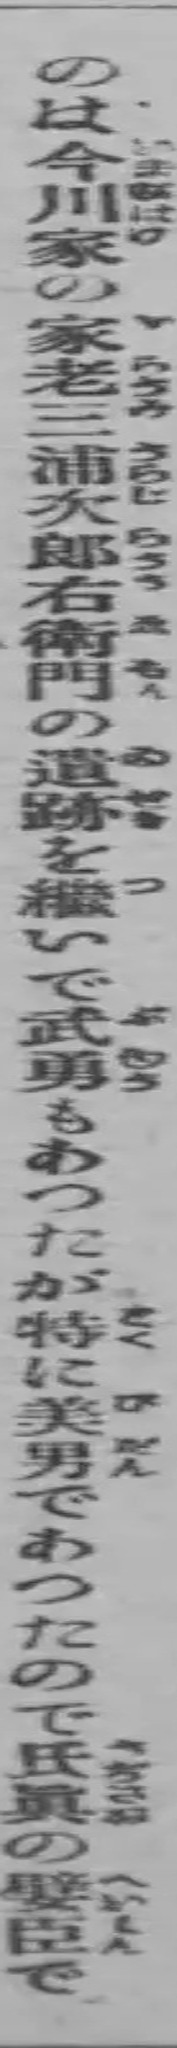のは今川家の家老三浦次郎右衛門の遺跡を継いで武勇もあつたが特に美男であつたので氏真の嬖臣で
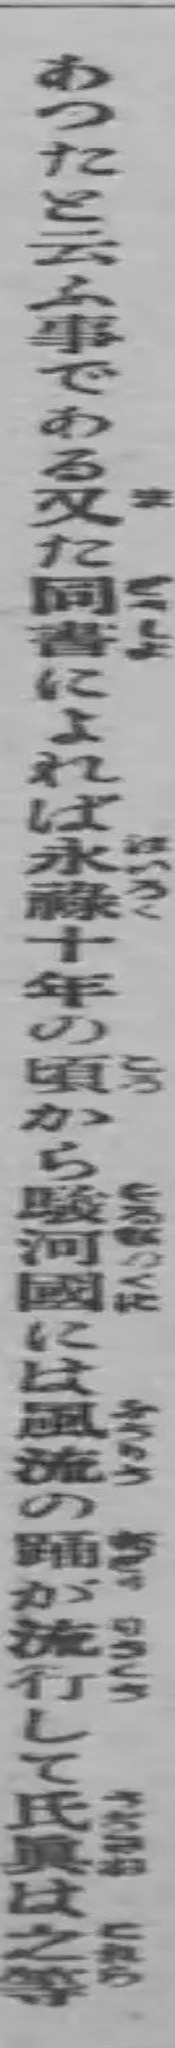あつたと云ふ事である又た同書によれば永禄十年の頃から駿河国には風流の踊が流行して氏真は之等
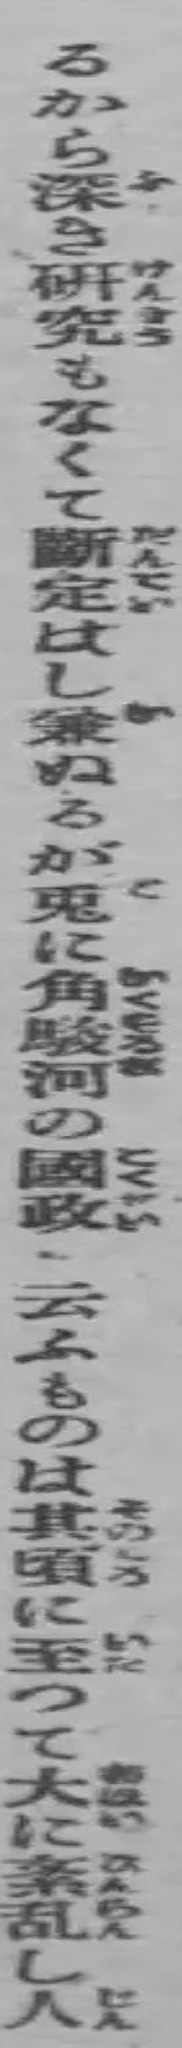るから深き研究もなくて断定はし兼ぬるが兎に角駿河の国政と云ふものは其頃に至つて大に紊乱し人
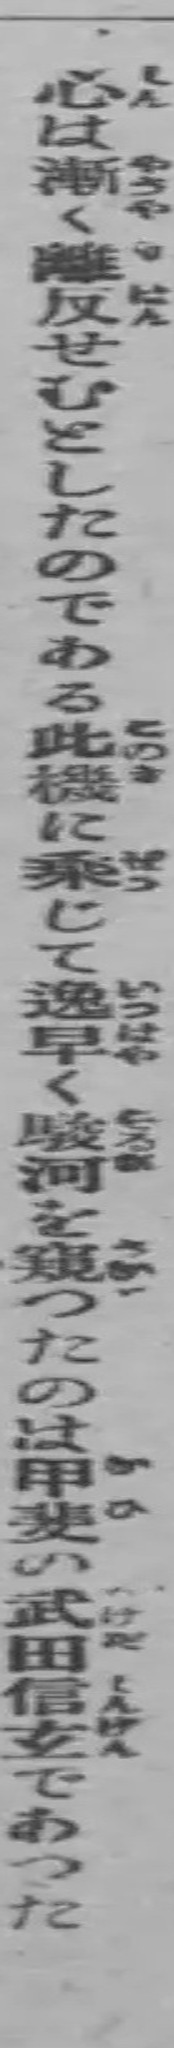心は漸く離反せむとしたのである此機に乗じて逸早く駿河を窺つたのは甲斐の武田信玄であつた
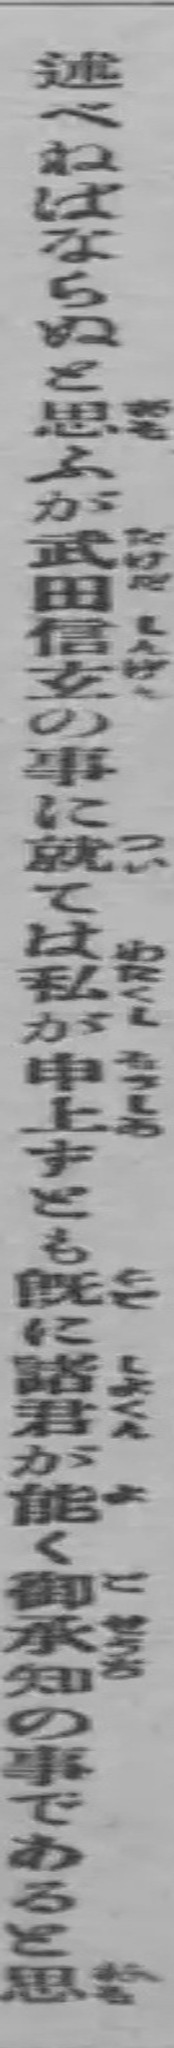述べねばならぬと思ふが武田信玄の事に就ては私が申上ずとも既に諸君が能く御承知の事であると思
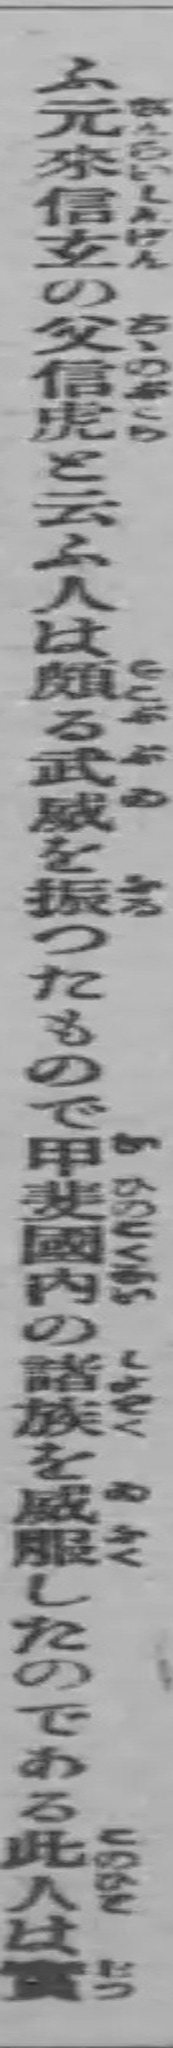武田信虎ふ元来信玄の父信虎と云ふ人は頗る武威を振つたもので甲斐国内の諸族を威服したのである此人は実
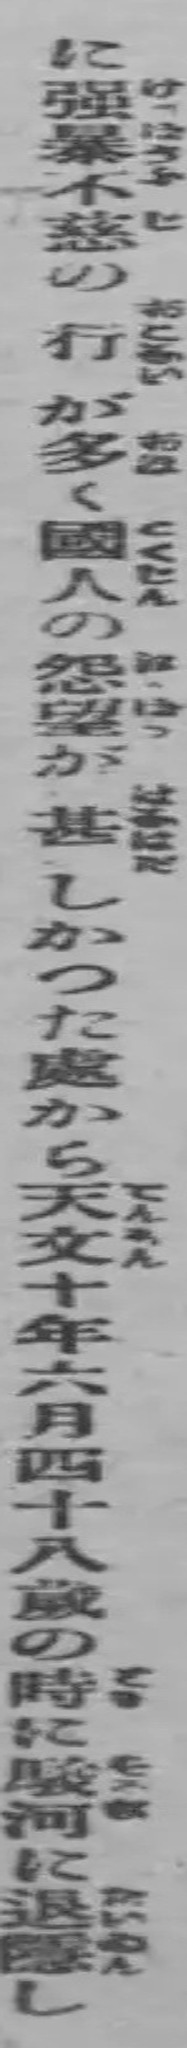に強暴不慈の行が多く国人の怨望が甚しかつた処から天文十年六月四十八歳の時に駿河に退隠し
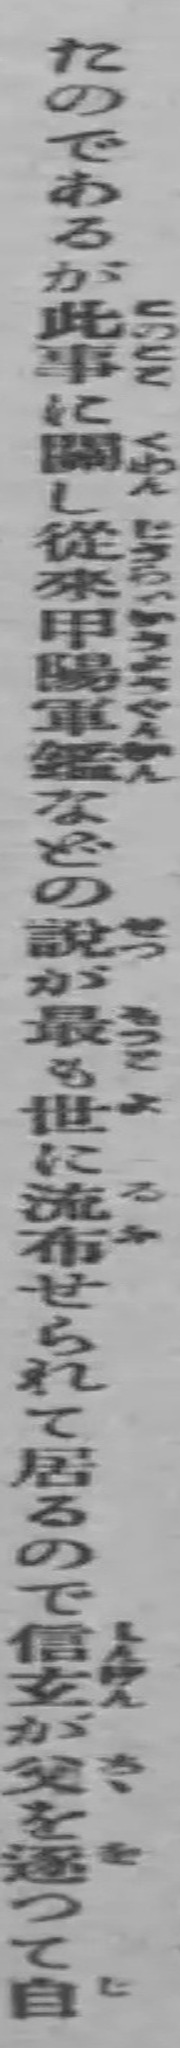甲陽軍鑑たのであるが此事に関し従来甲陽軍鑑などの説が最も世に流布せられて居るので信玄が父を遂つて自
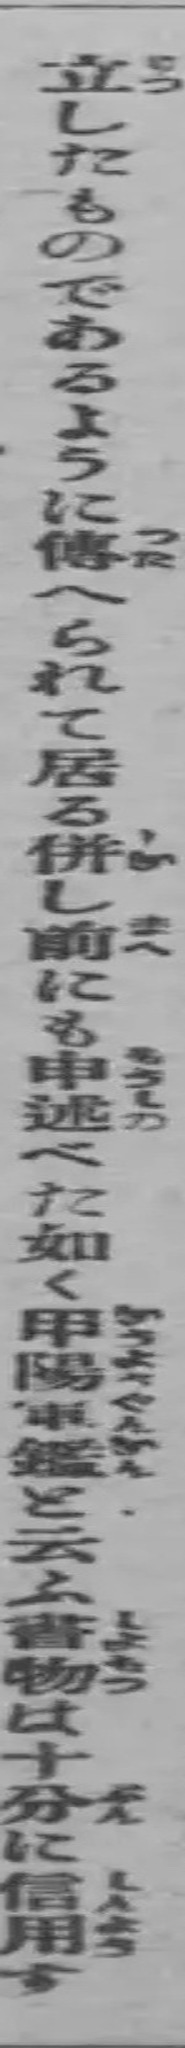立したものであるように伝へられて居る併し前にも申述べた如く甲陽軍鑑と云ふ書物は十分に信用す
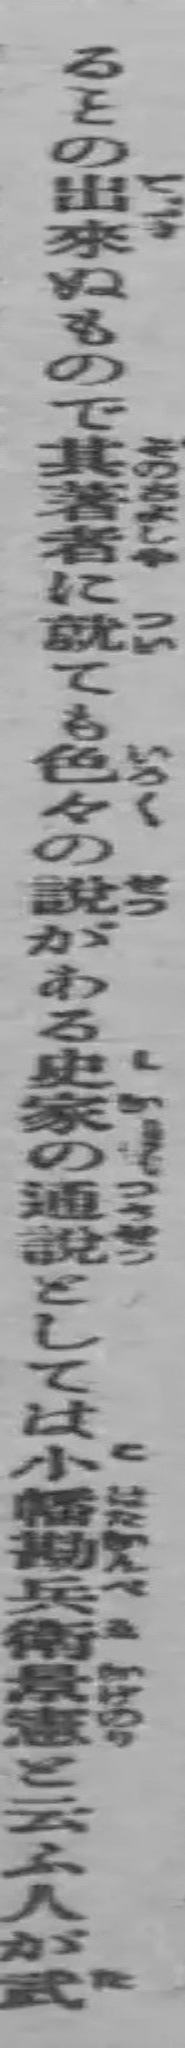ることの出来ぬもので其著者に就ても色々の説がある史家の通説としては木幡勘兵衛景憲と云ふ人が武
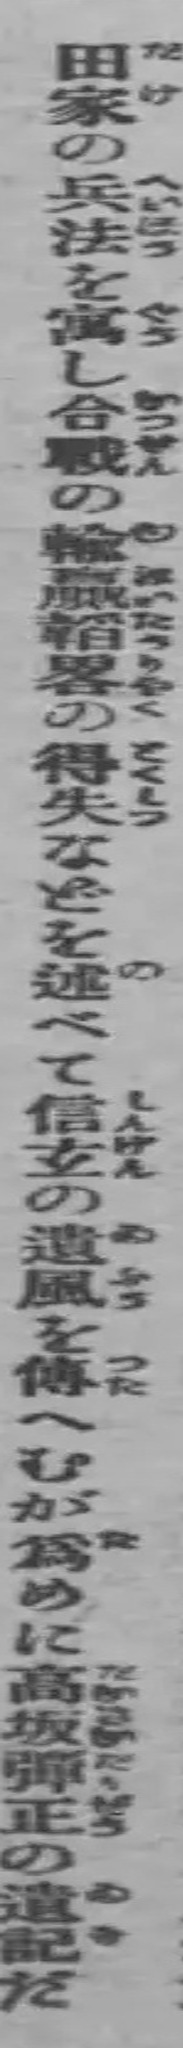田家の兵法を寓し合戦の輸嬴韜略の得失などを述べて信玄の遺風を伝へむが為めに高坂弾正の遺記だ
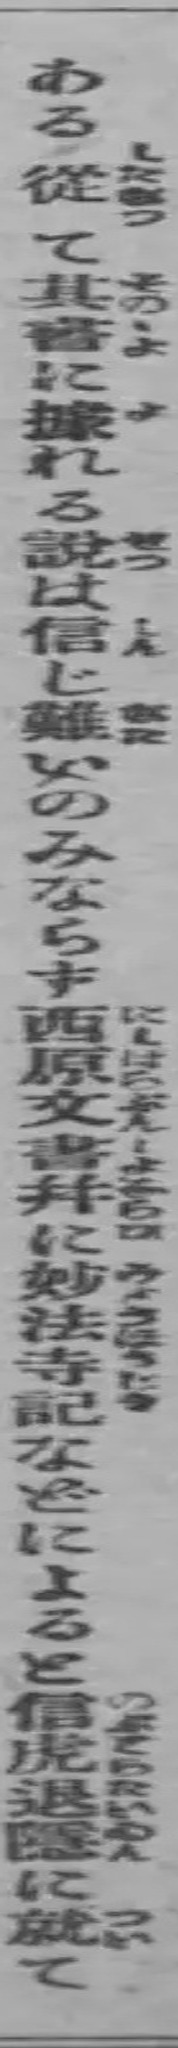ある従て其書に拠れる説は信じ難いのみならず西原文書幷に妙法寺記などによると信虎退隠に就て
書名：豊橋市史談
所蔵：国立国会図書館 National Diet Library, JAPAN
